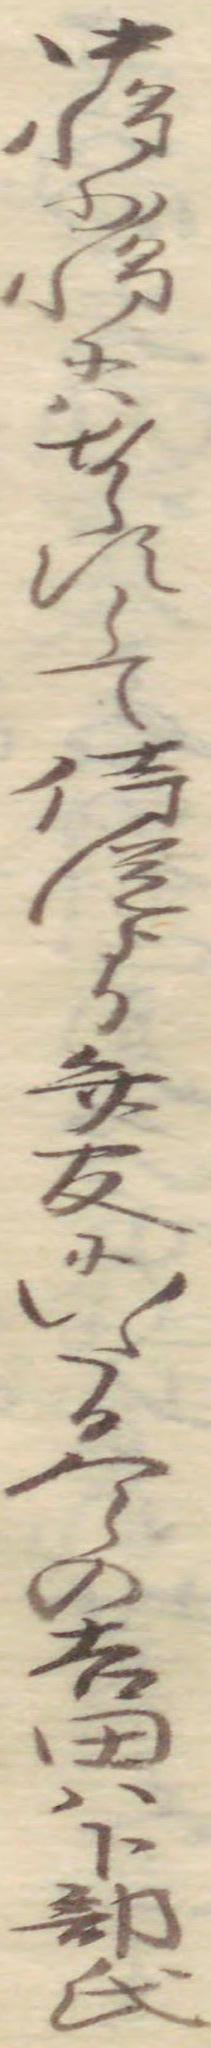中将少将にはならすして侍従より弁官にいたる今の吉田は卜部氏
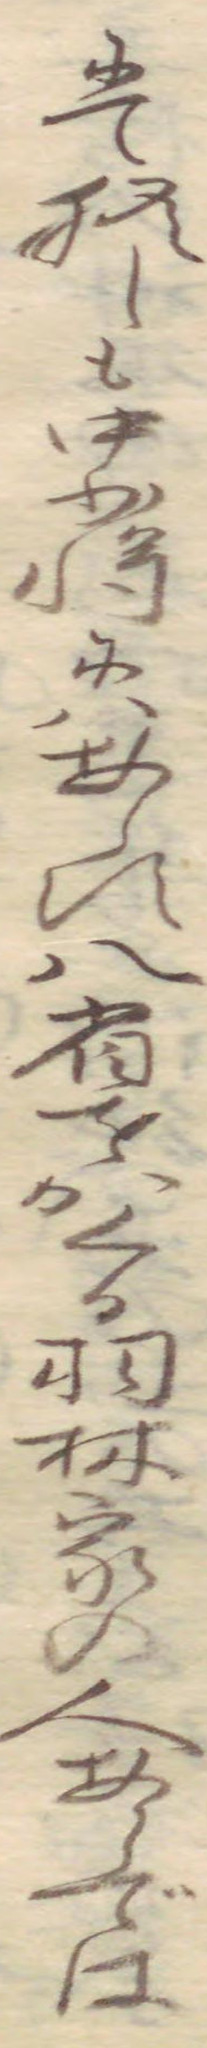にて猶しも中少将にはならす八省をかくる羽林家の人ならでは
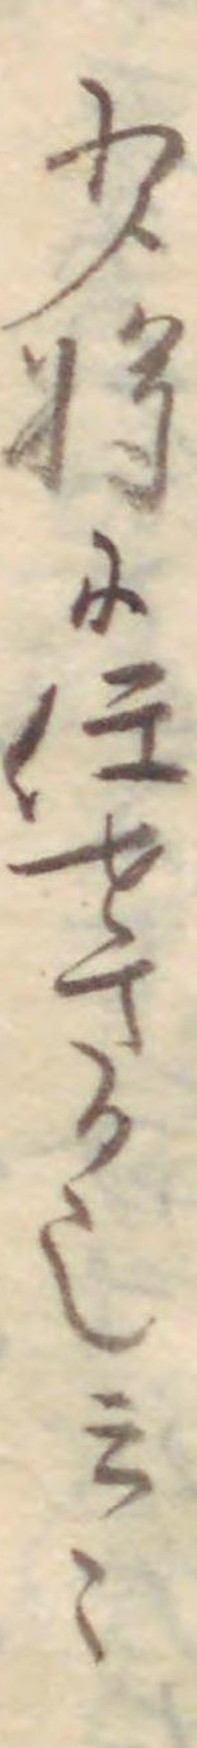少将に任せさる也云〻
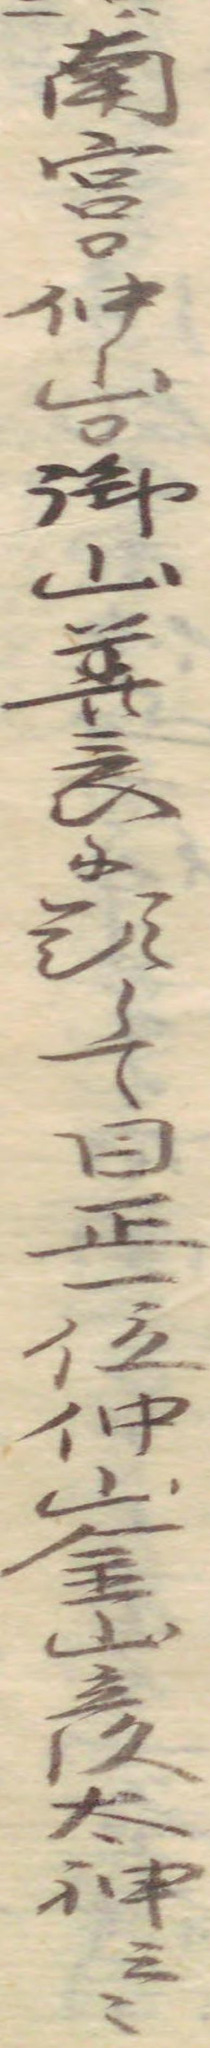南宮○仲山○御山華表に題して曰正一位仲山金山彦太神云〻
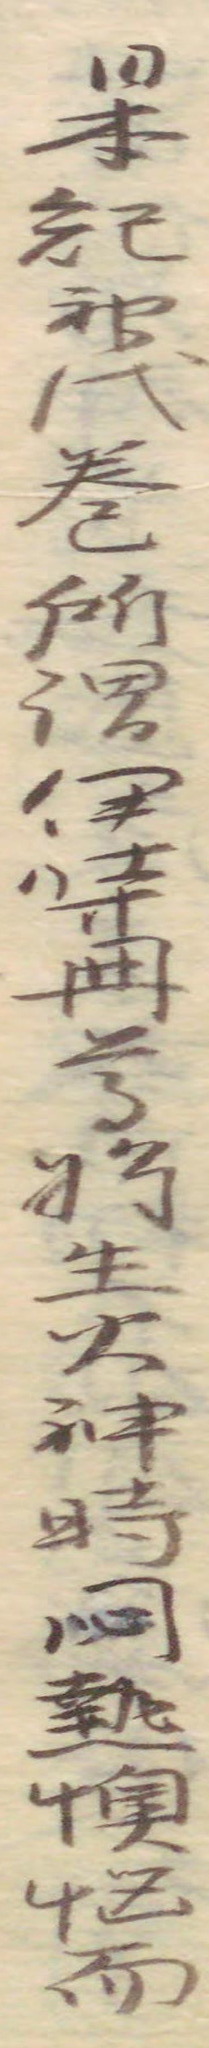日本記神代巻所謂伊弉冉尊将生火神悶熱懊悩而

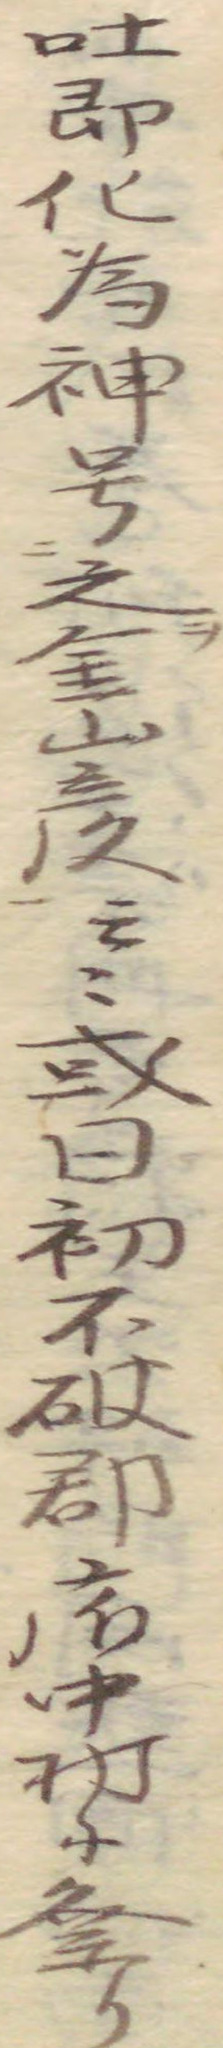吐即化為神号之金山彦云〻或曰初不破郡府中村に祭り
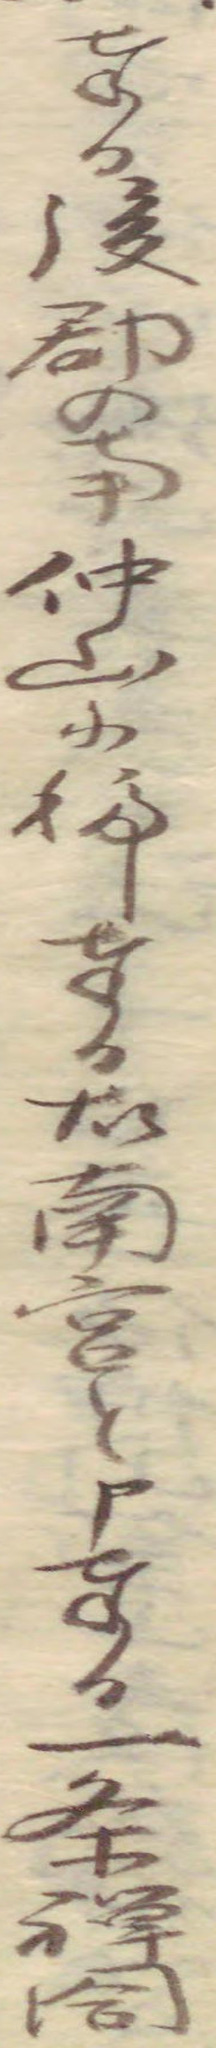奉る後郡の南仲山に移し奉る故南宮と申奉る一条禅閤
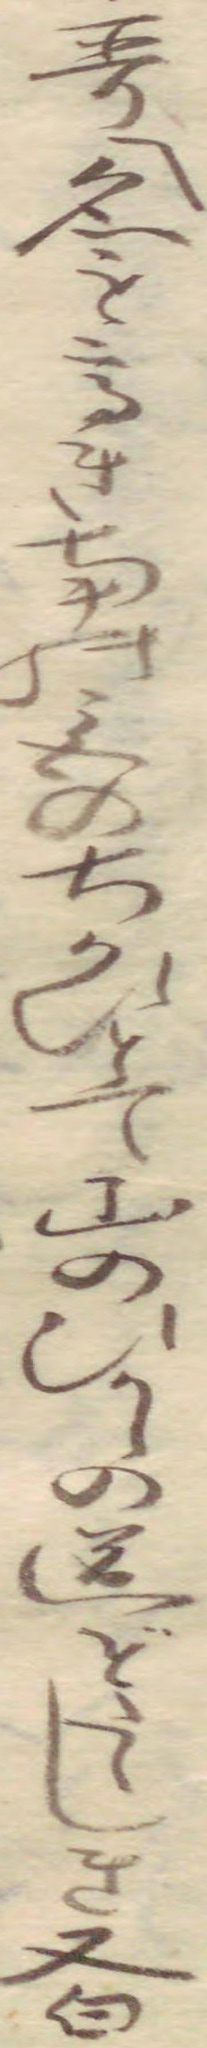歌〽名も高き南の宮のちかひとて山のひかしの道ぞたゝしき又曰
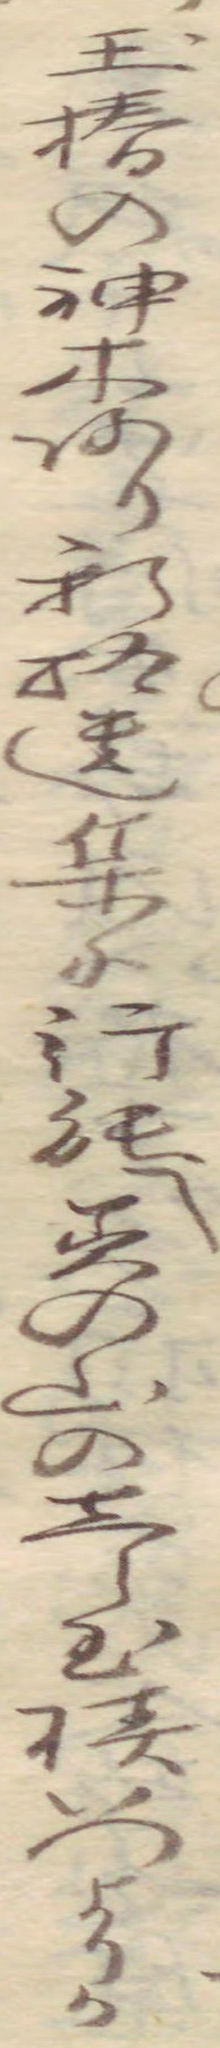玉椿の神木あり新拾遺集に行能〽美の山のしら玉椿いつよりか
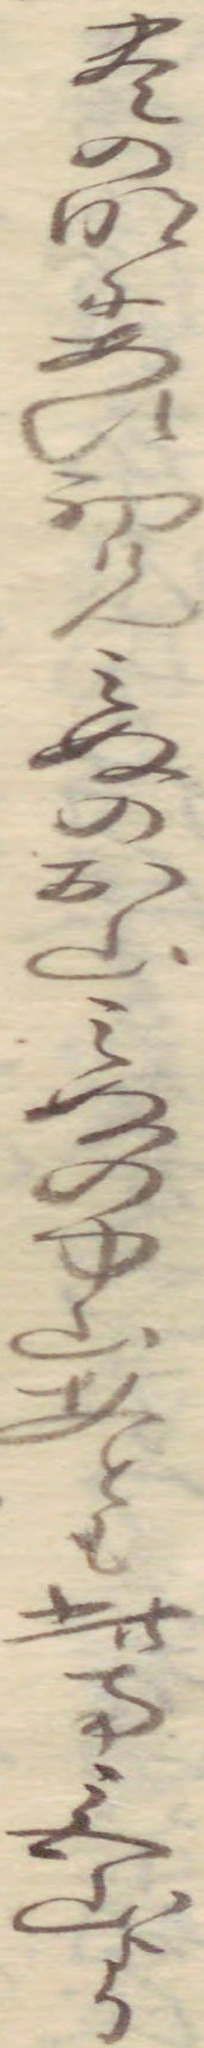豊の明にあひ初けんみぬのお山みぬの中山なとも此南宮山より
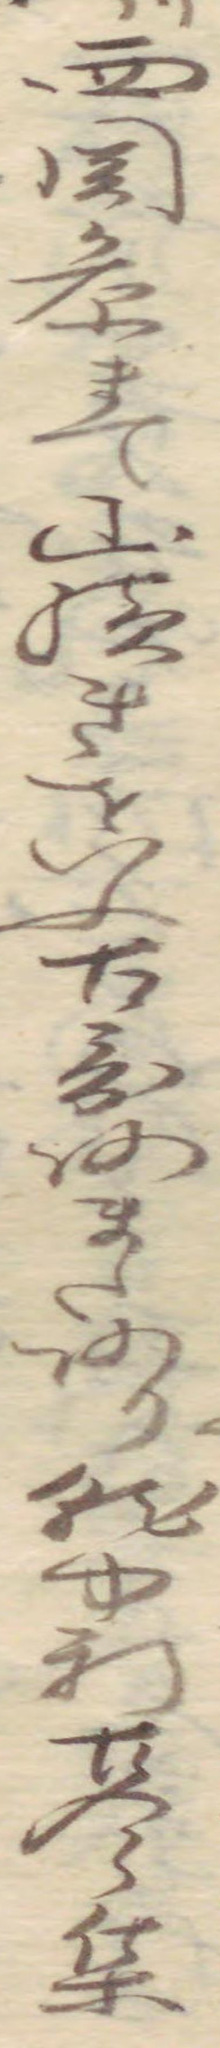西関ヶ原まて山続きをいふ古歌あまたあり就中新古今集
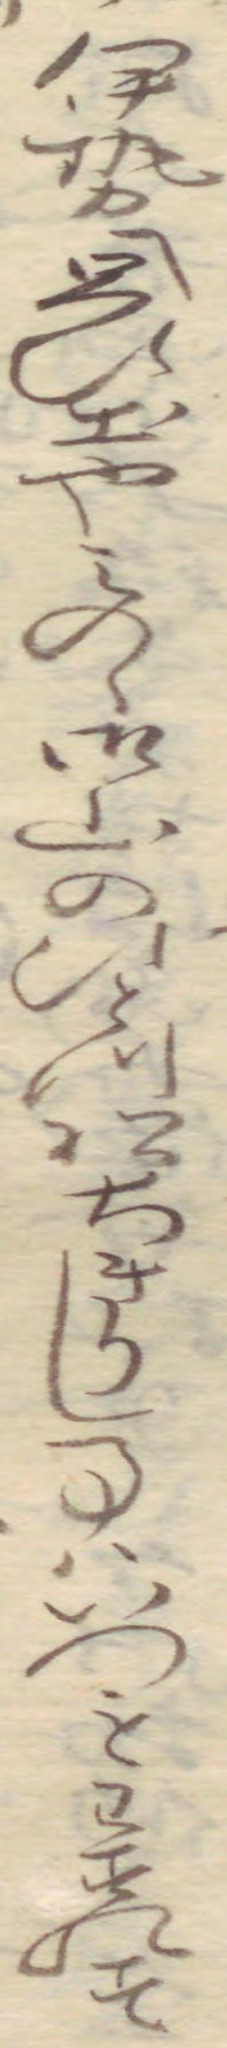伊勢〽思ひ出やみのゝ御山のひとつ松ちきりし事はいつもわすれす
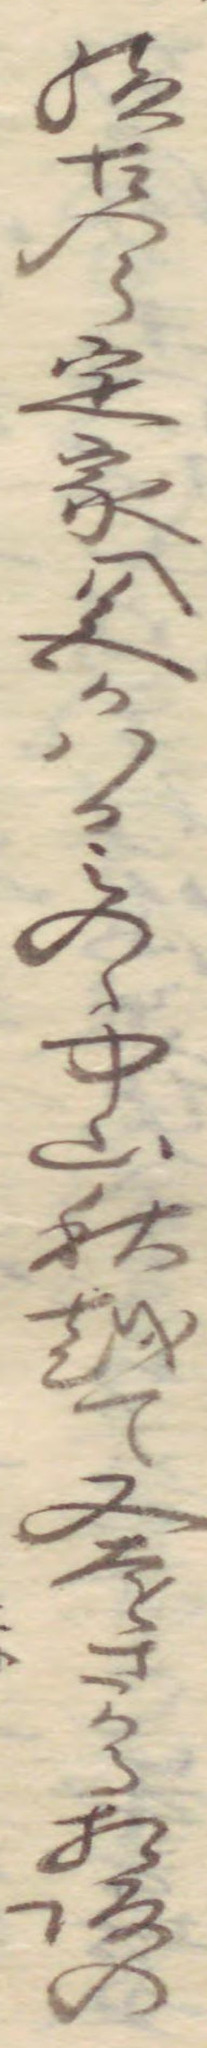続古今定家〽色かはるみのゝ中山秋越て又遠さかる相坂の
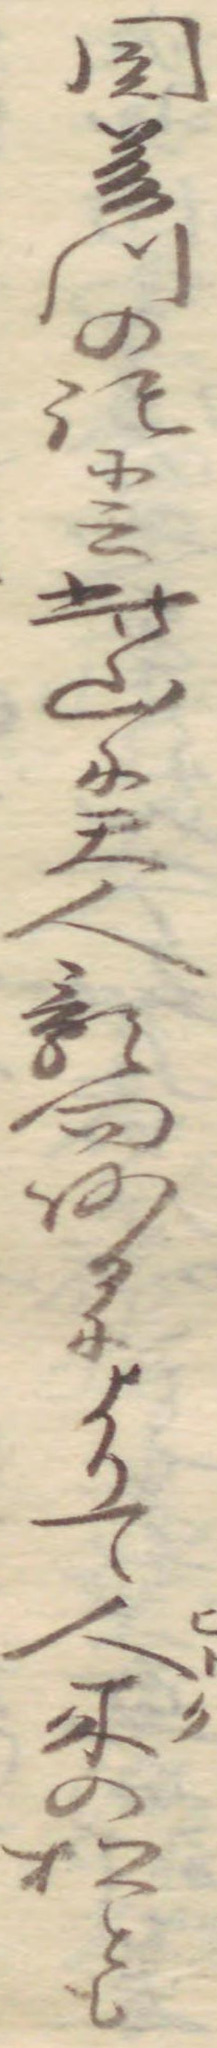関藤川の記に云此山に天人影向あるによりて人来の松とも
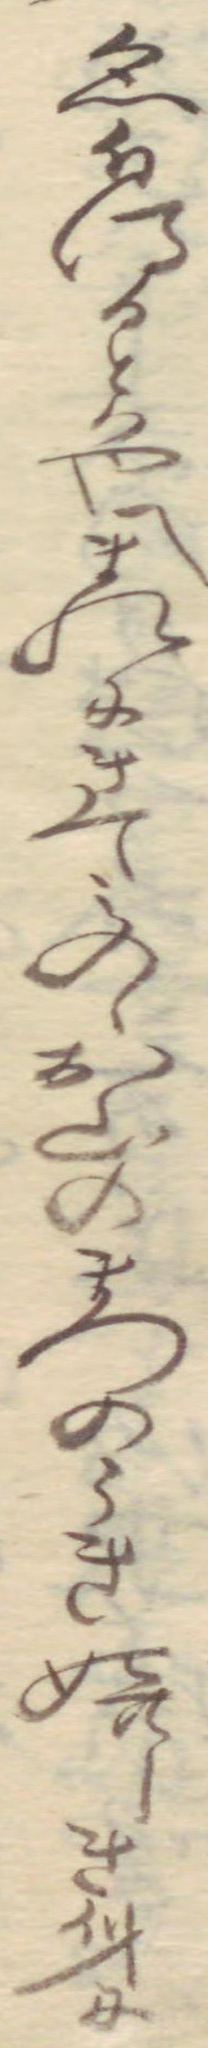名付侍るとかや〽まれにきてみのゝお山のまつのうき嬉しき身に
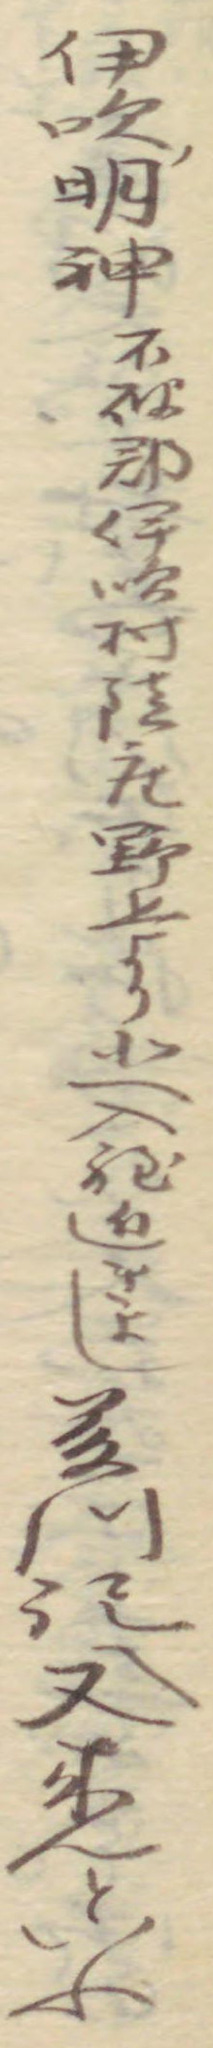伊吹ノ明神不破郡伊吹村鎮座野上より北へ入程近きよし藤川記〽又来んといふ
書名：鶯宿雑記. 巻263-264
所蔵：国立国会図書館 National Diet Library, JAPAN
